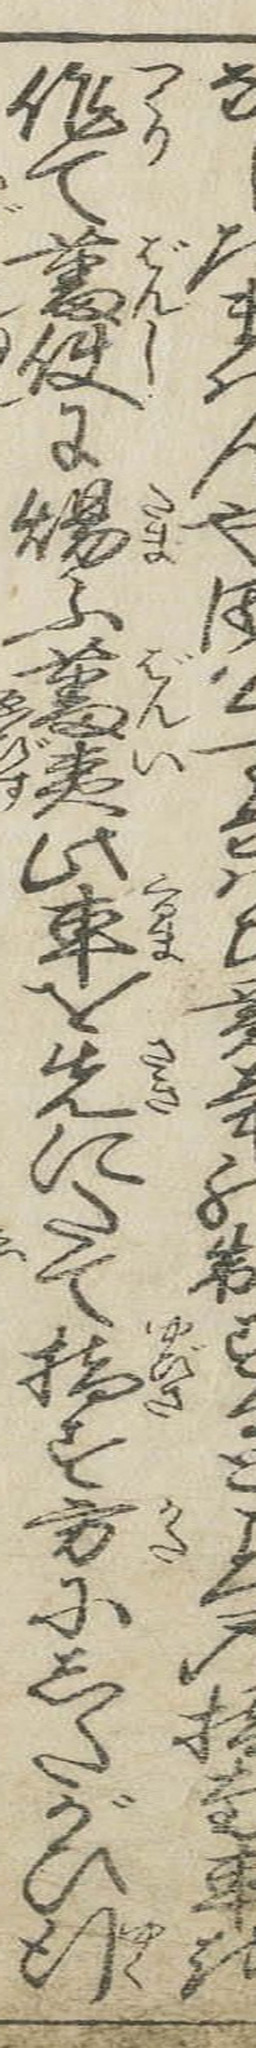作て蕃使に賜ふ蕃夷此車を先にたて指す方にしたがひ行
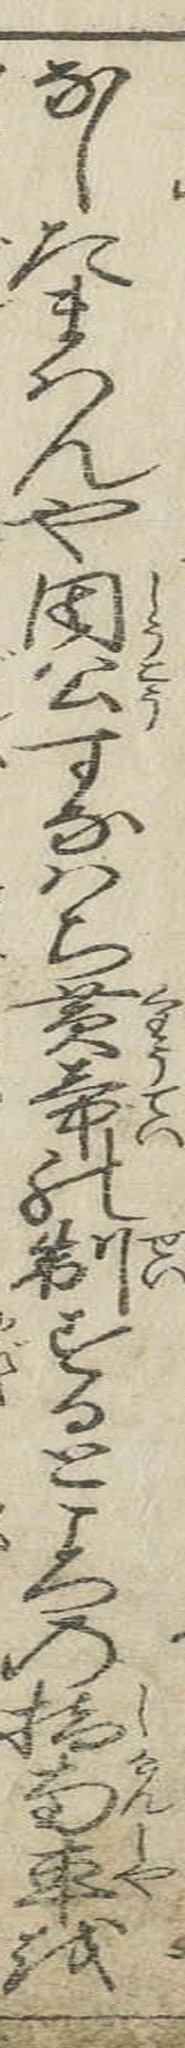なしたまはんや周公すなはち黄帝の制するところの指南車を
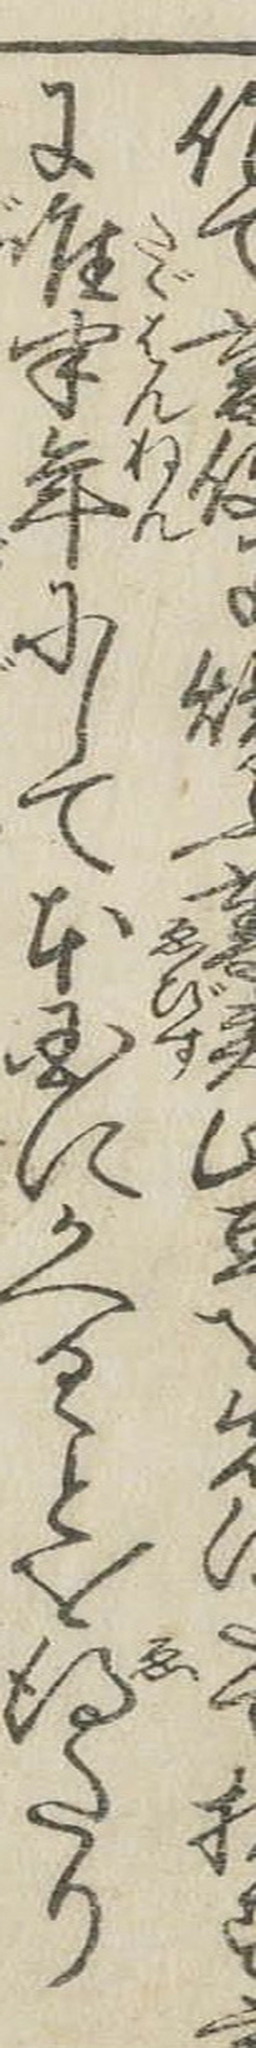に唯半年にして本国にかへることを得たり
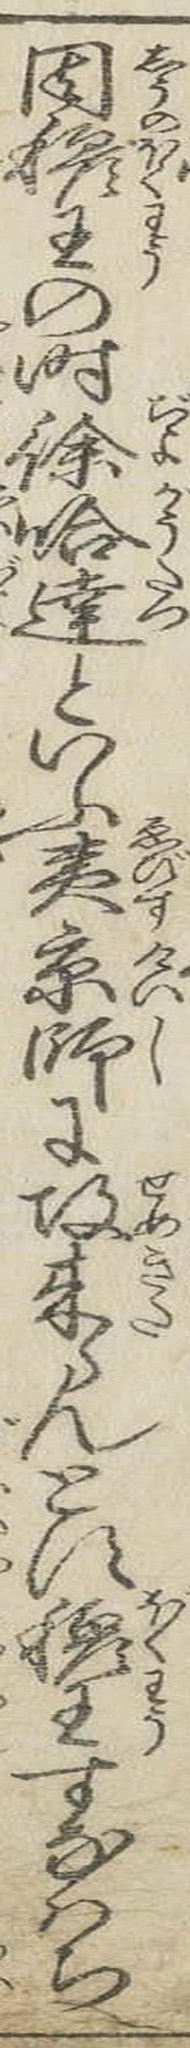周穆王の時徐哈達といふ夷京師に攻来らんとす穆王すなはち
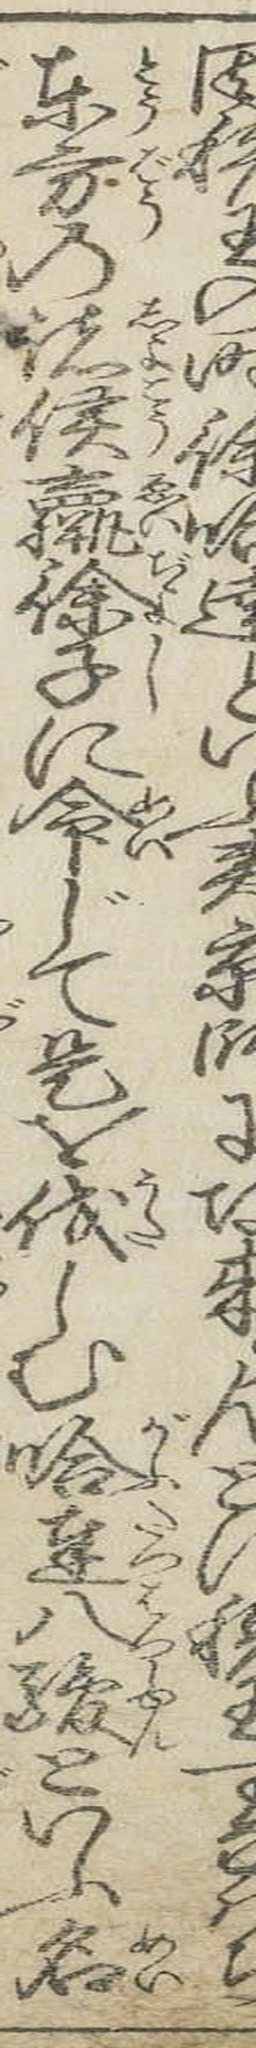東方の諸侯羸徐子に命じて是を伐しむ哈達八駿といふ名
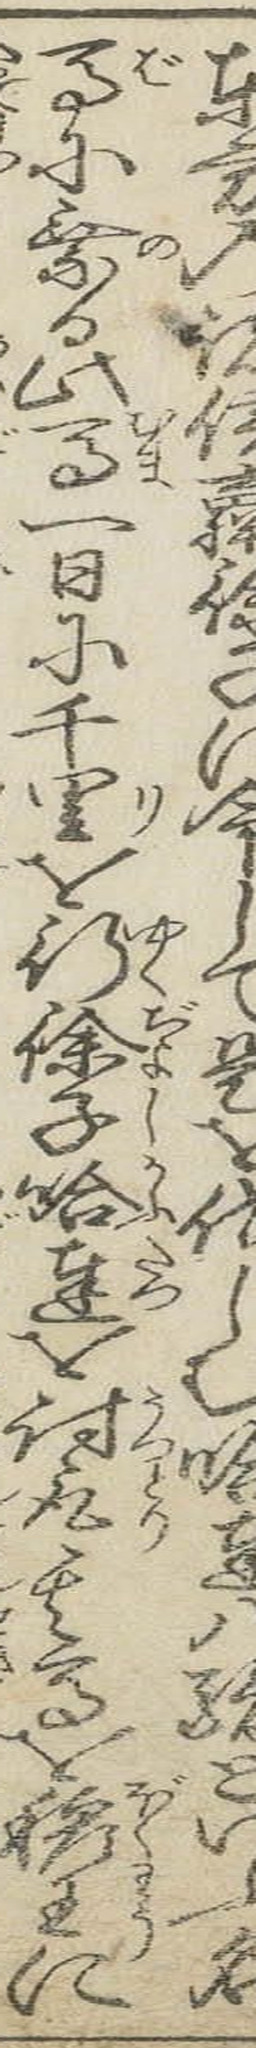馬に乗る此馬一日に千里を行徐子哈達を討取其馬を穆王に
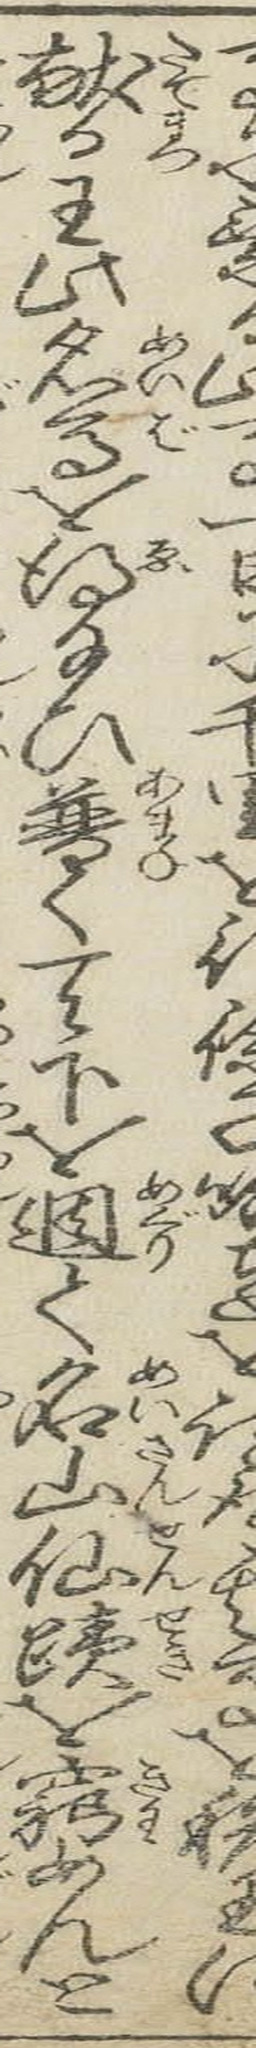献る王此名馬を得給ひ普く天下を週て名山仙蹟を窮めんと
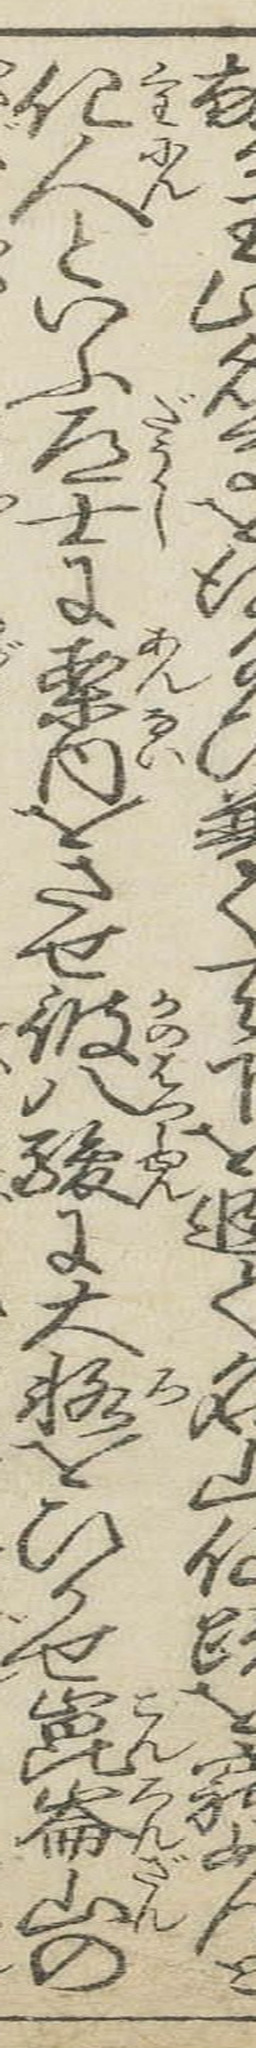化人といふ道士に案内をさせ彼八駿に大輅をひかせ崑崙山の
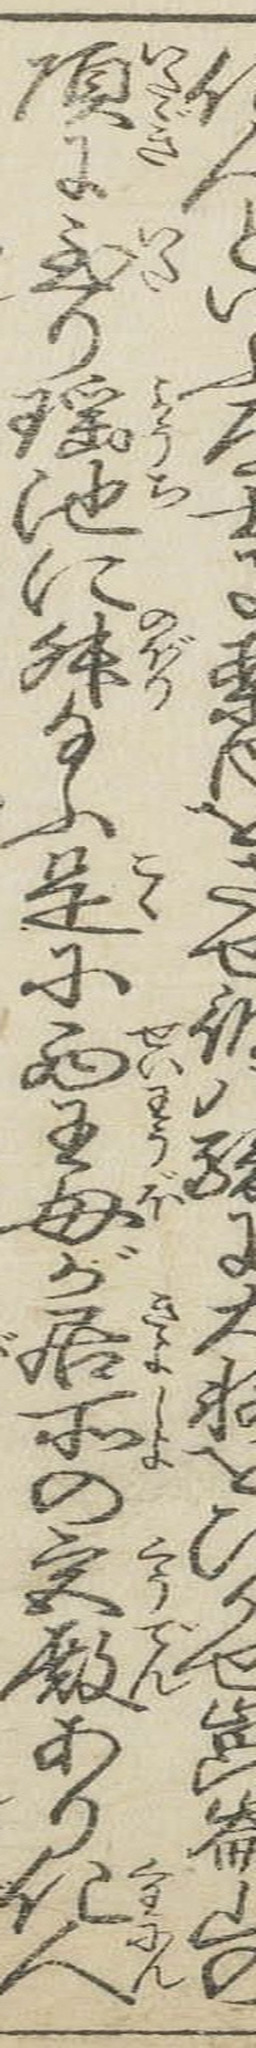頂に至り瑤池に升給ふ是に西王母が居所の宮殿あり化人
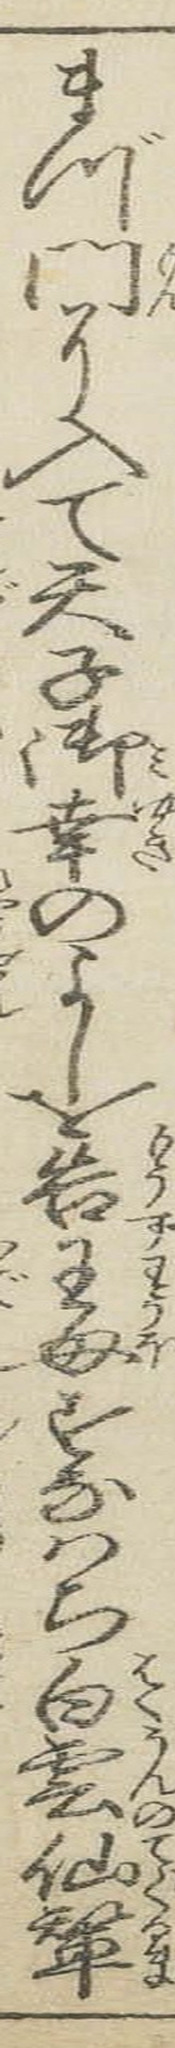まづ門に入て天子御幸のよしを告王母すなはち白雲仙輦
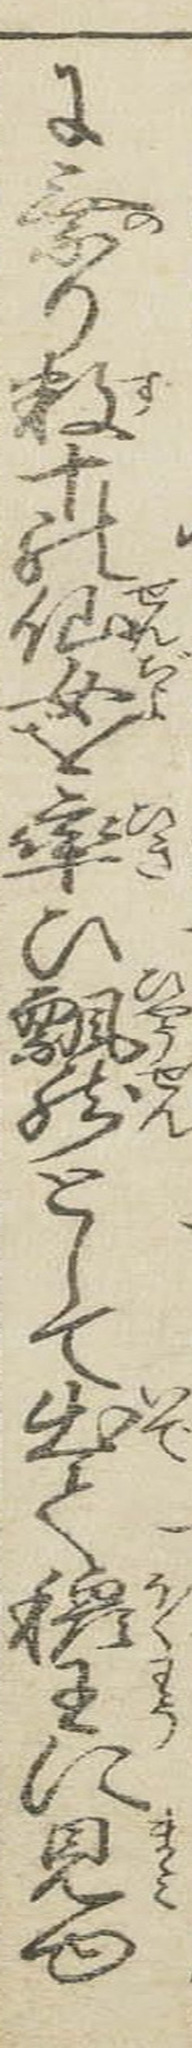に乗り数十の仙女を率ひ飄然として出て穆王に見ゆ

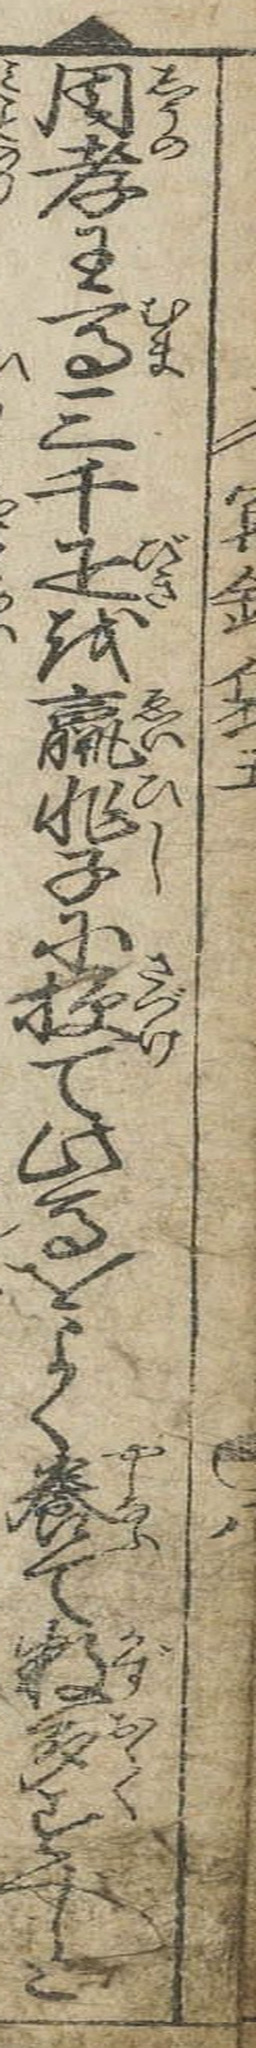周孝王馬三千疋を羸非子に授て此馬をよく養て数多すべしと
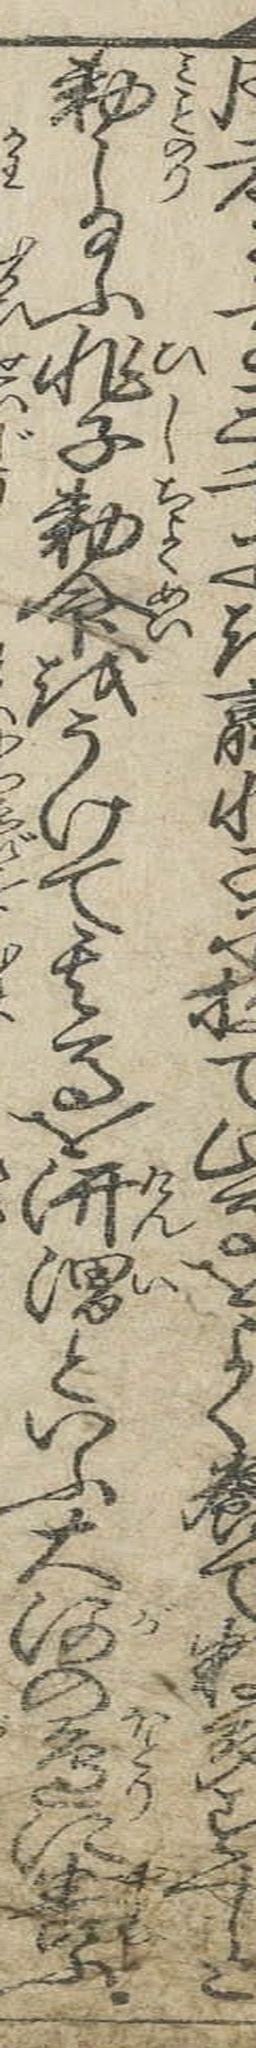勅し給ふ非子勅命をうけて其馬を汧渭といふ大河の辺に養ふ。
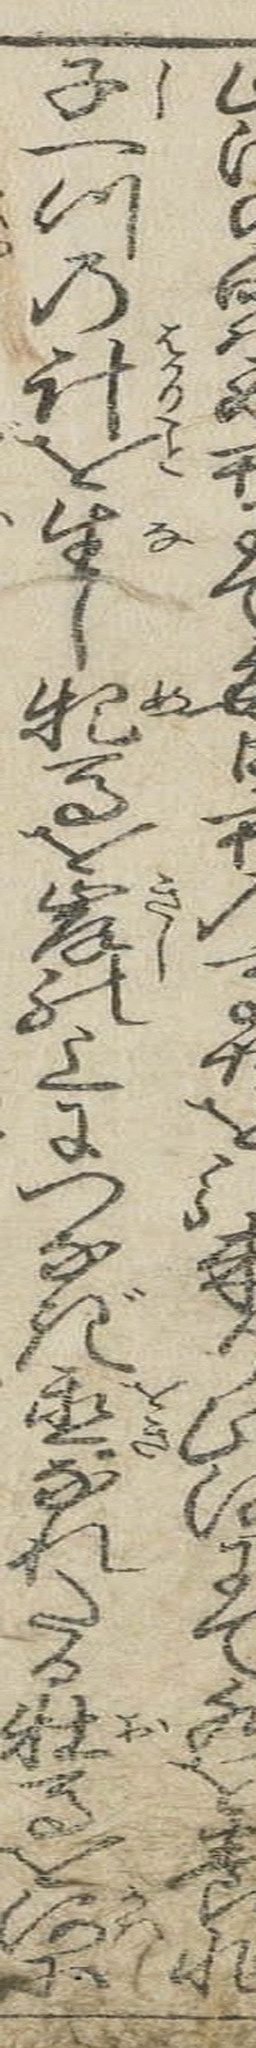子一つの計を生し牝馬を岸の上につなぎ置。なれたる牡馬を河に
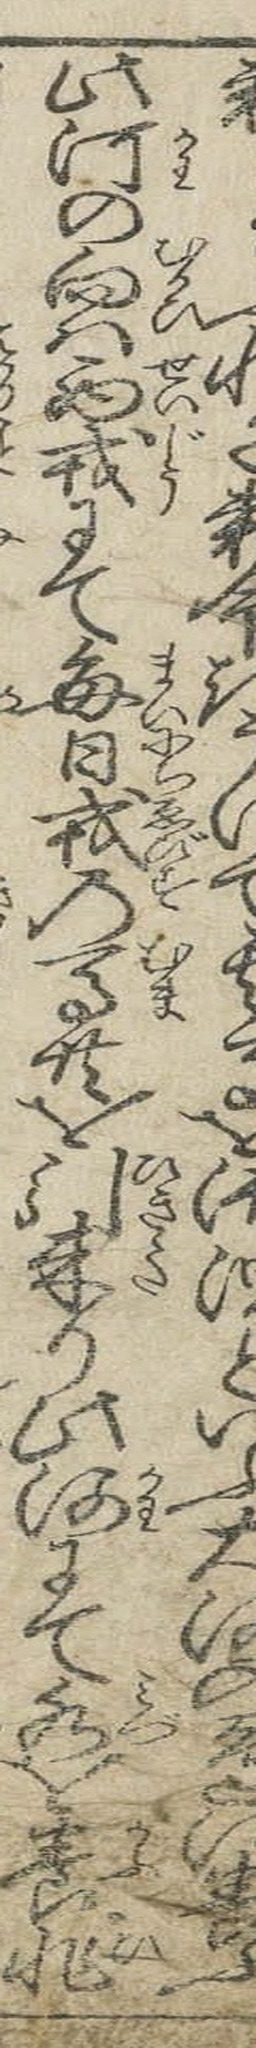此河の向は西戎にて毎日戎の馬共を引来り此河にて水を養。非
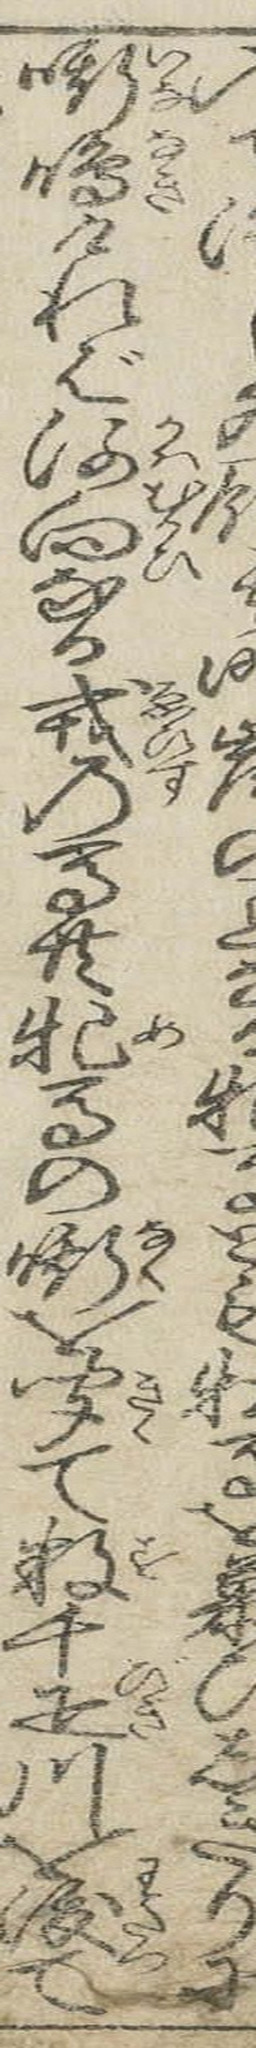嘶鳴ければ河向なる戎の馬共牝馬の嘶を聞て数千疋川を渡て
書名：絵本写宝袋 9巻 5之巻
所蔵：東京学芸大学教育コンテンツアーカイブ
